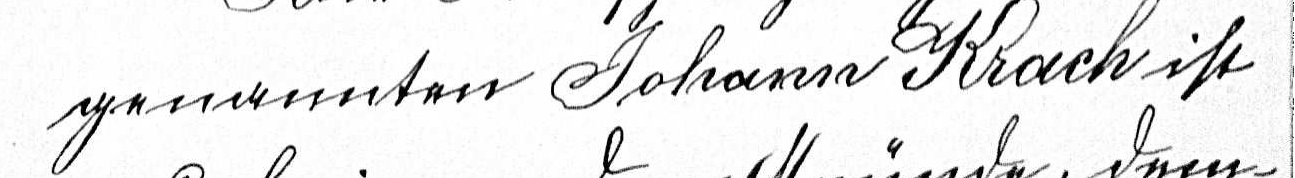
genannten Johann Krach ist
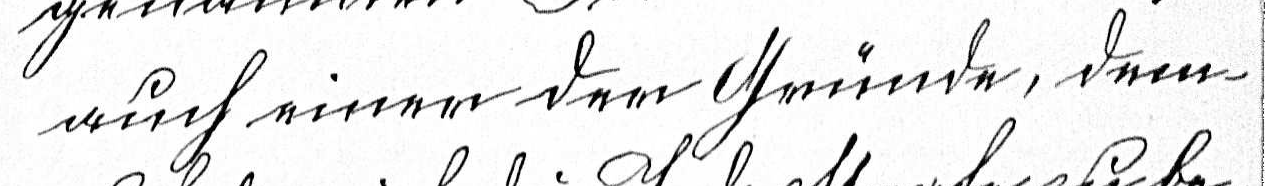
auch einer der Gründe, dem¬
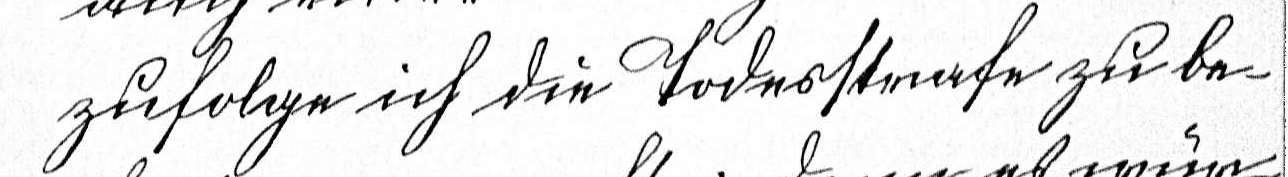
zufolge ich die Todesstrafe zu be¬
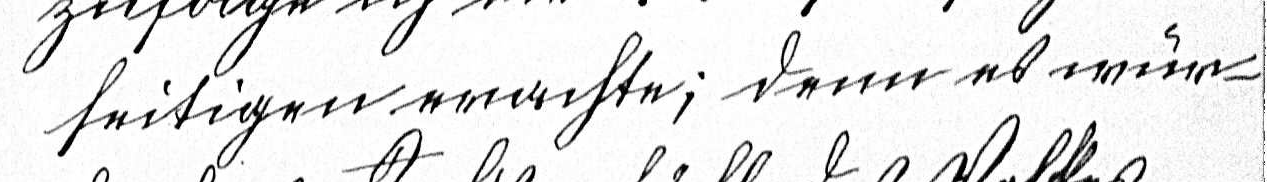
seitigen erachte; denn es wür¬
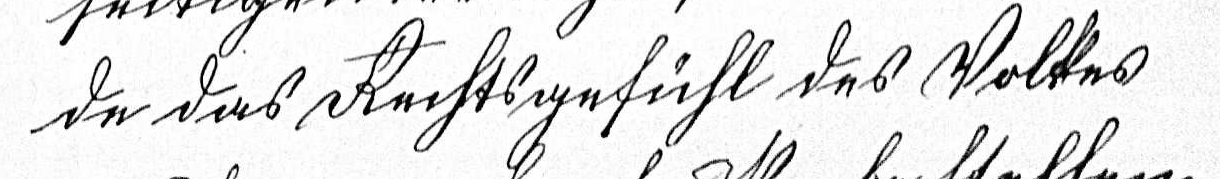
de das Rechtsgefühl des Volkes
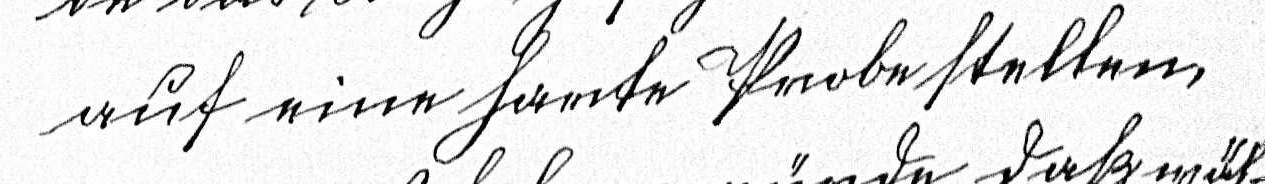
auf eine harte Probe stellen,
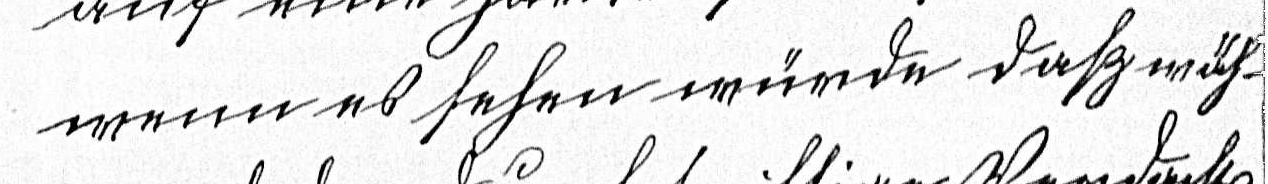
wenn es sehen würde daß wäh¬
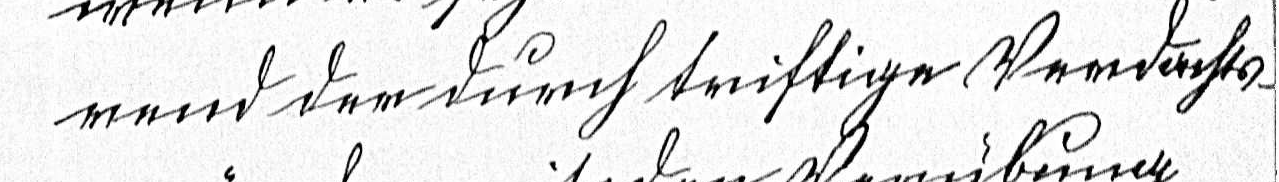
rend der durch tristige Verdachts¬
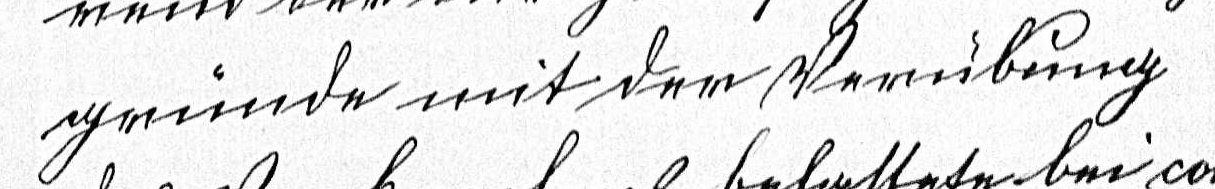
gründe mit der Verübung
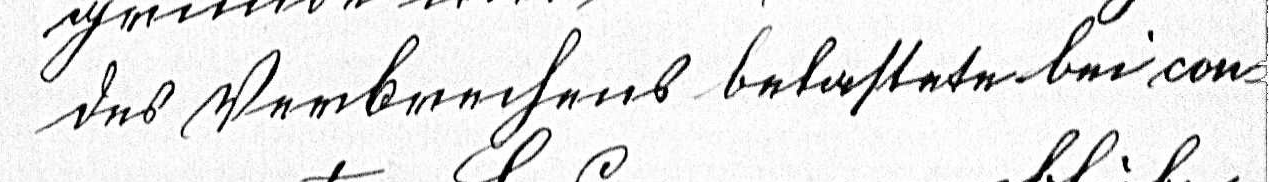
des Verbrechens belastete bei con¬
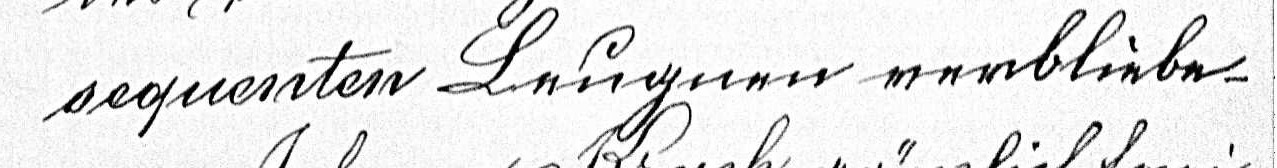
sequenten Leugnen verbliebe¬
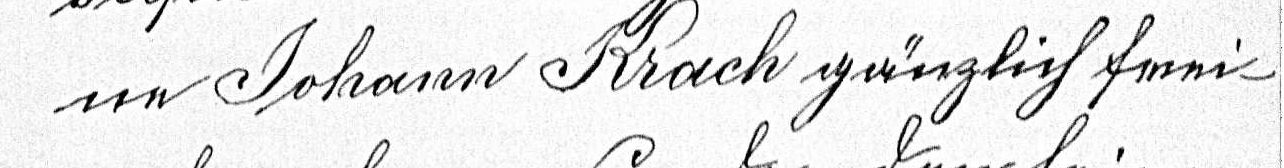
ne Johann Krach gänzlich frei¬
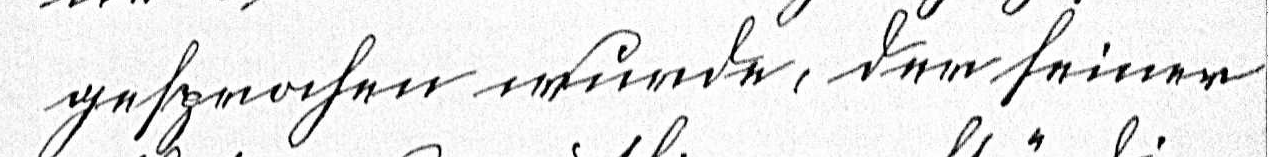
gesprochen wurde, der seiner
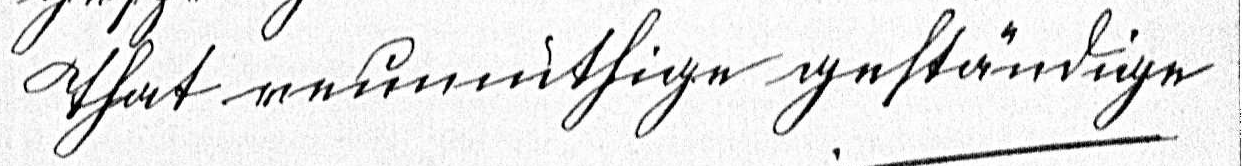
That reumuthige geständige
